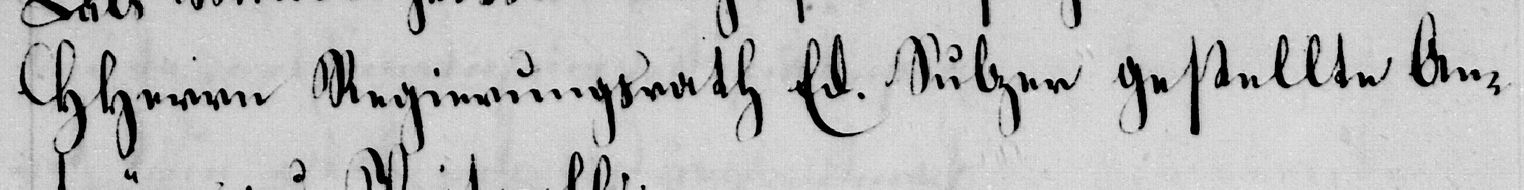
Herrn Regierungsrath Ed. Sulzer gestellten An¬
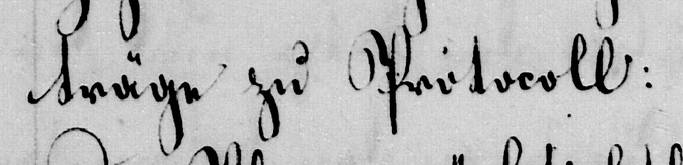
träge zu Protocoll:
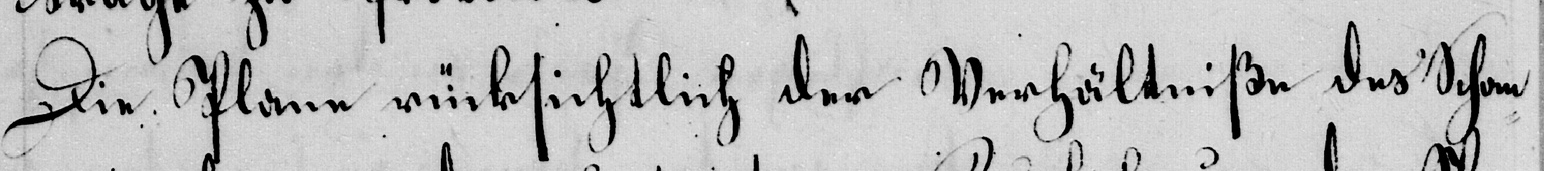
Die Plane rücksichtlich der Verhältniße des Schan¬
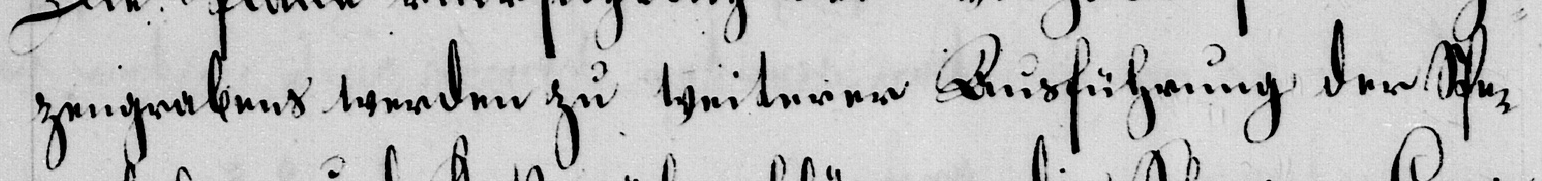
zengrabens werden zu weiterer Ausführung der Spe¬
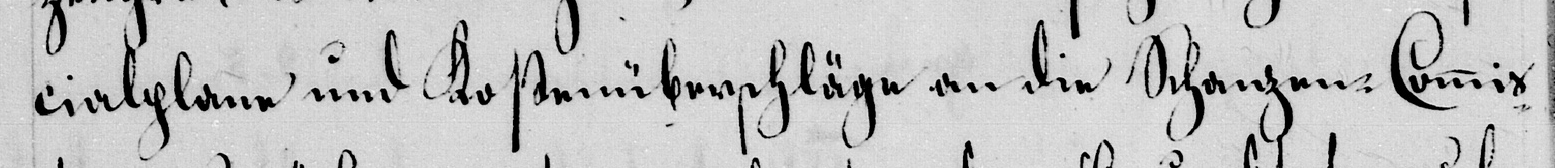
cialplane und Kostenüberschläge an die Schanzen-Commi¬
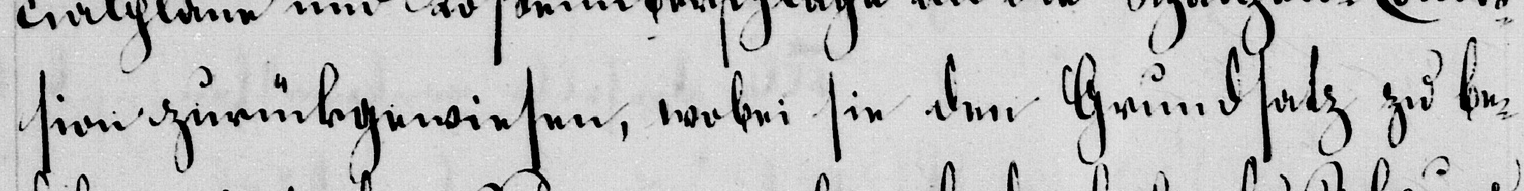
ßion zurückgewiesen, wobei sie den Grundsatz zu be¬
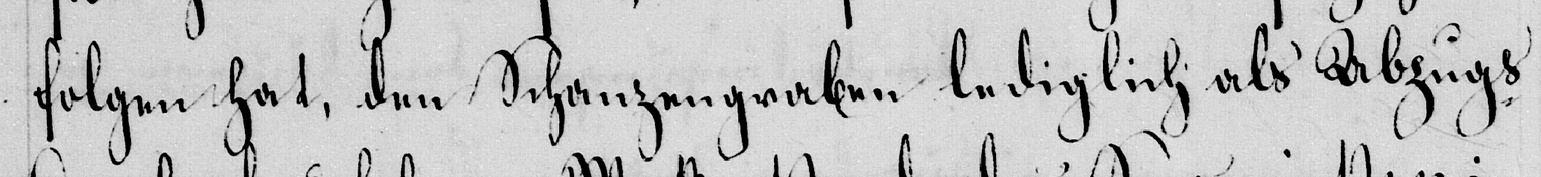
folgen hat, den Schanzengraben lediglich als Abzug¬
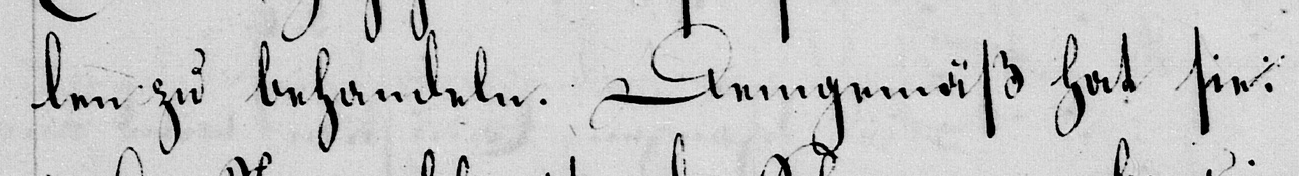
len zu behandeln. Demgemäß hat sie:
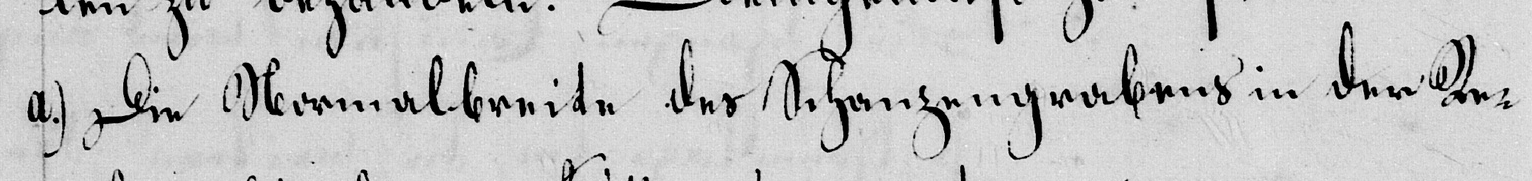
a.) Die Normalbreite des Schanzengrabens in der Re¬
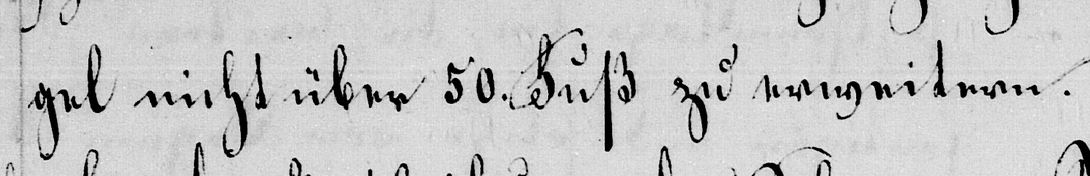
gel nicht über 50. Fuß zu erweitern.
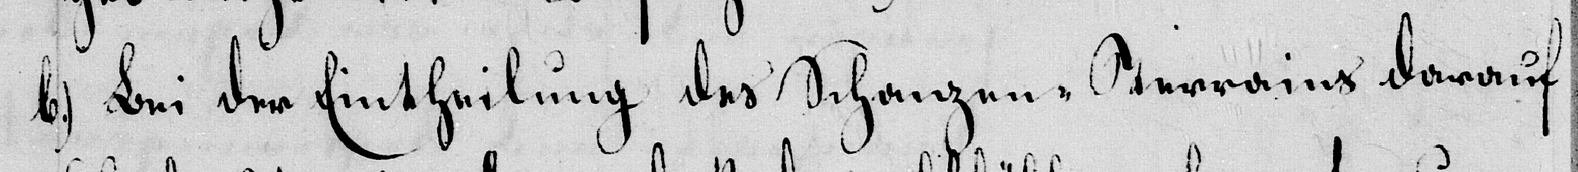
b.) Bei der Eintheilung des Schanzen-Terrains darauf
